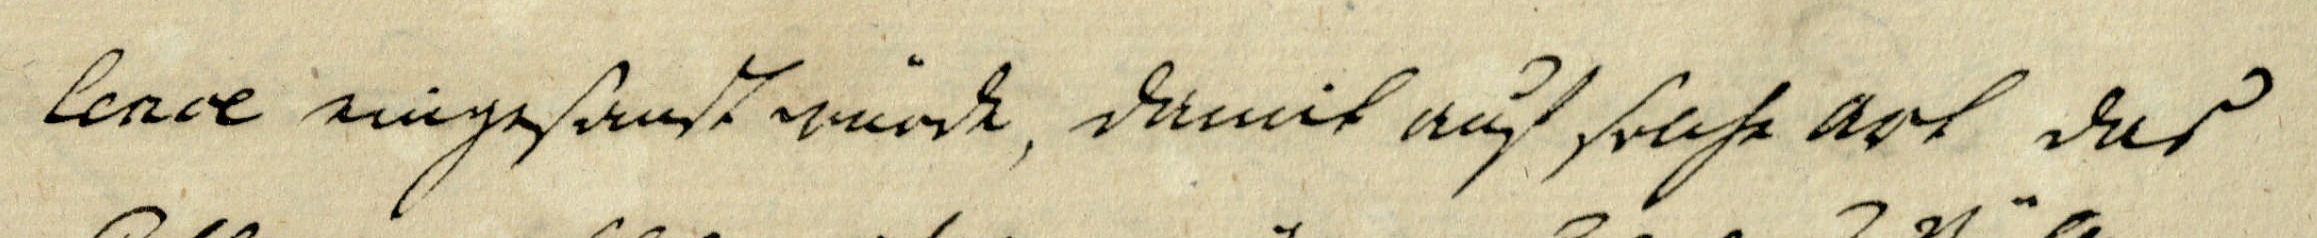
lence eingesandt würde, damit auf solche Art das
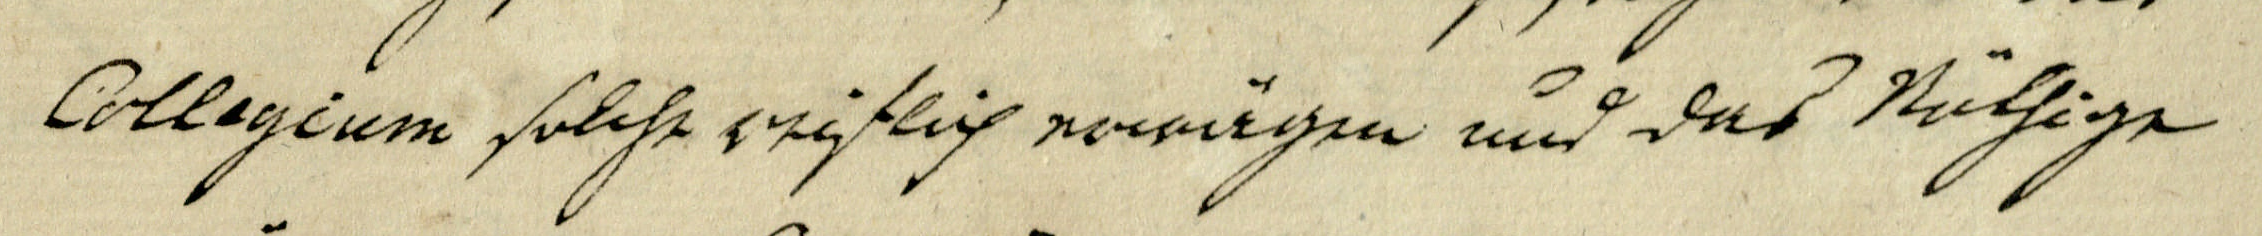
Collegium solche reiflich erwägen und das Nöthige
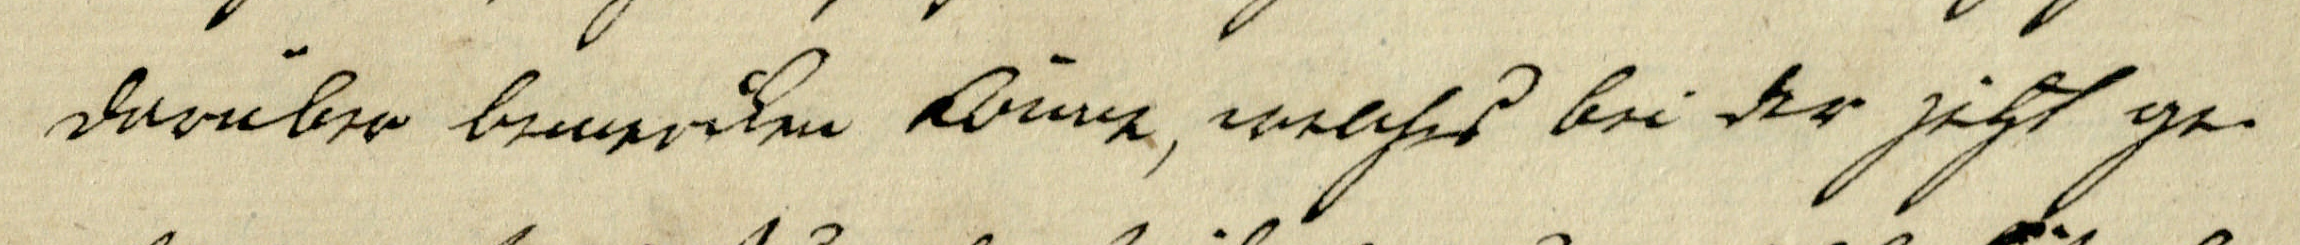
darüber bemercken könne, welches bei der jetzt ge¬
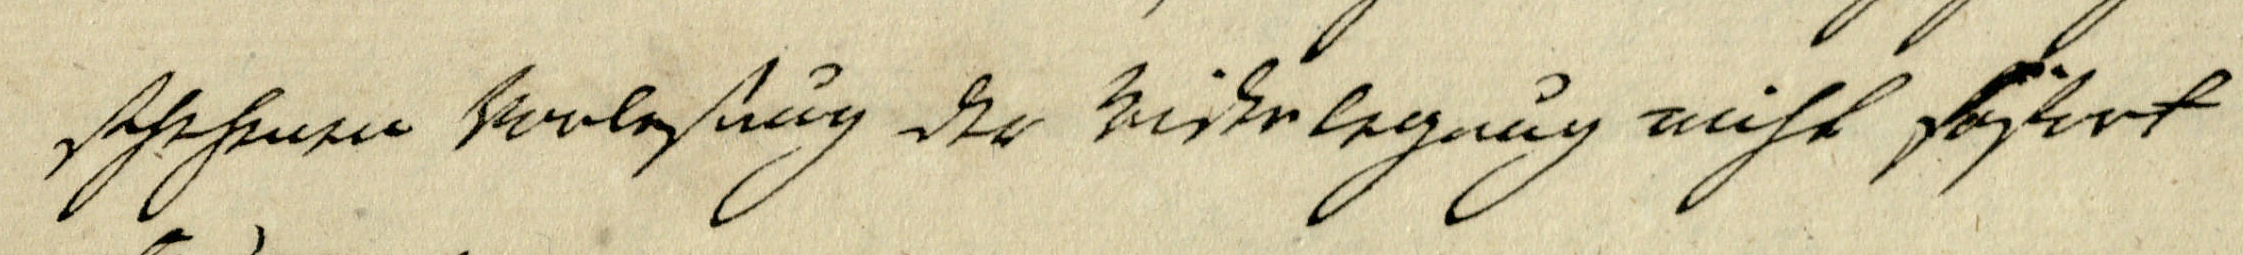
geschehenen Vorlesung der Widerlegung nicht sofort
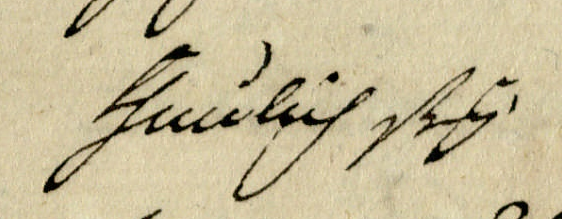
thunlich seÿ.
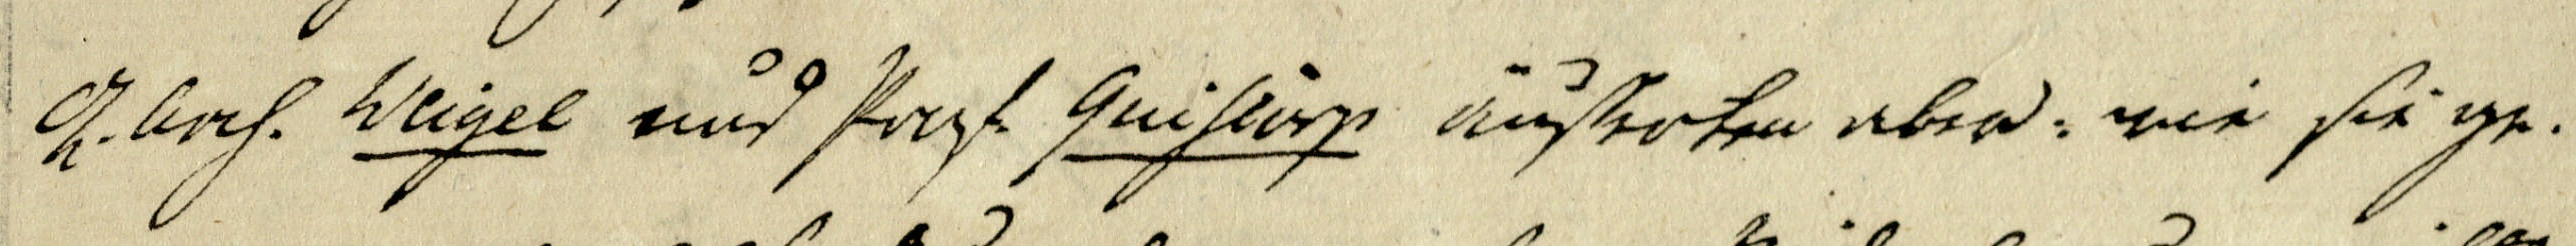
dh. Arch. Weigel und Prof. Quistorp äusserten aber: wie sie ge¬
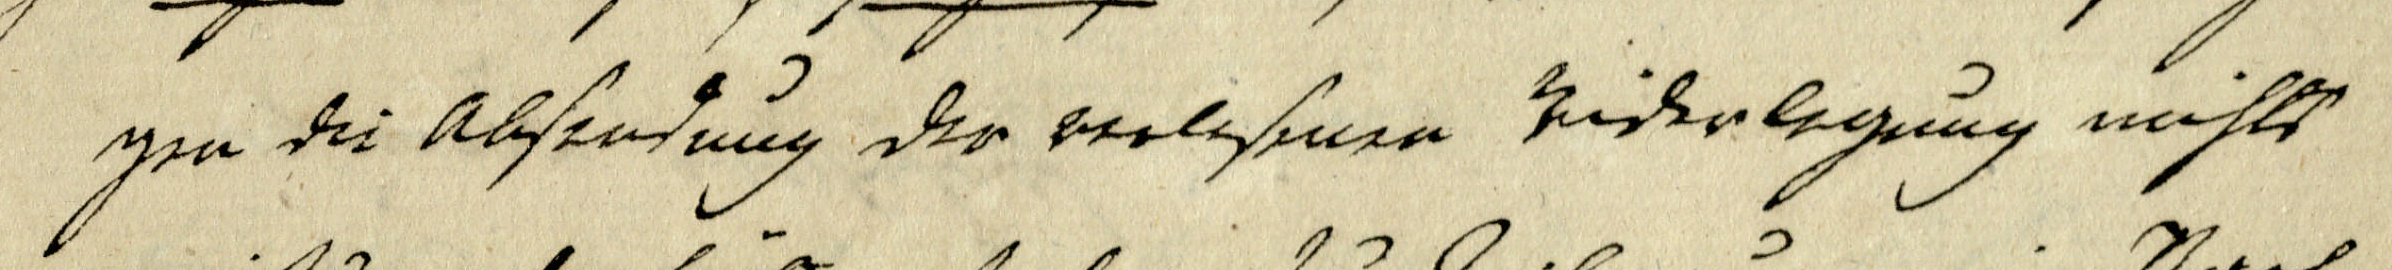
gen die Absendung der verlesenen Widerlegung nichts
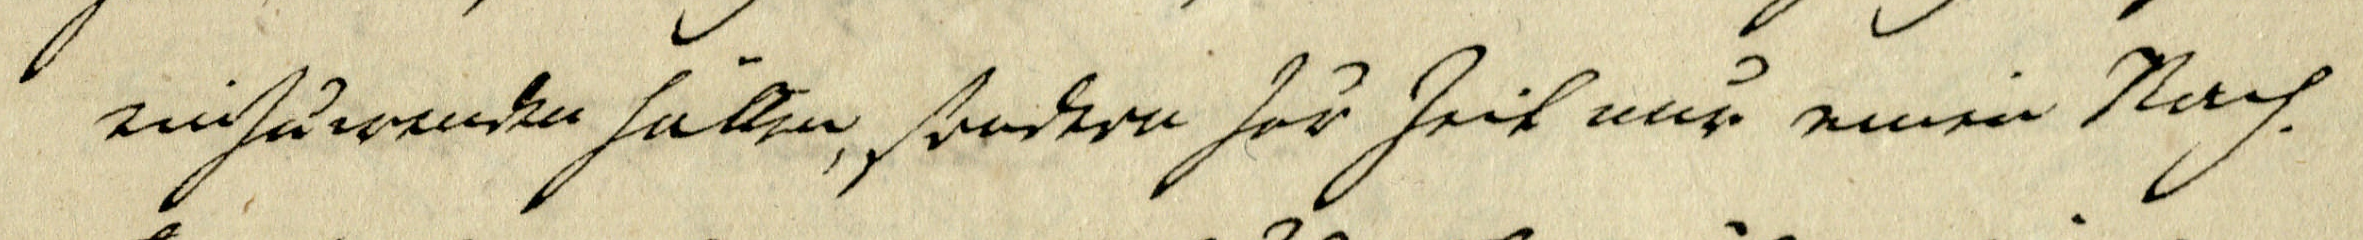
einzuwenden hätten, sondern zur Zeit nur einen Nach¬
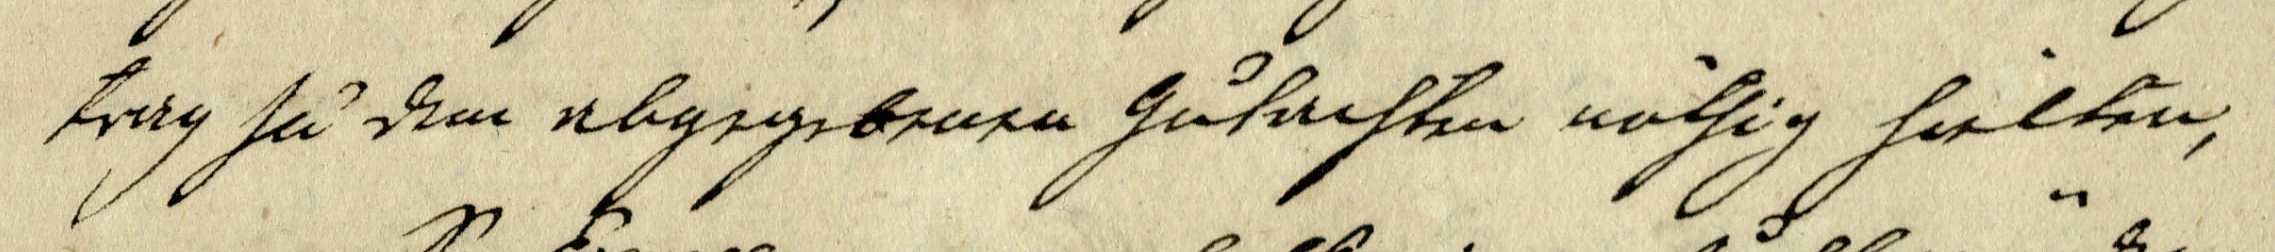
trag zu dem abgegebenen Gutachten nöthig hielten,
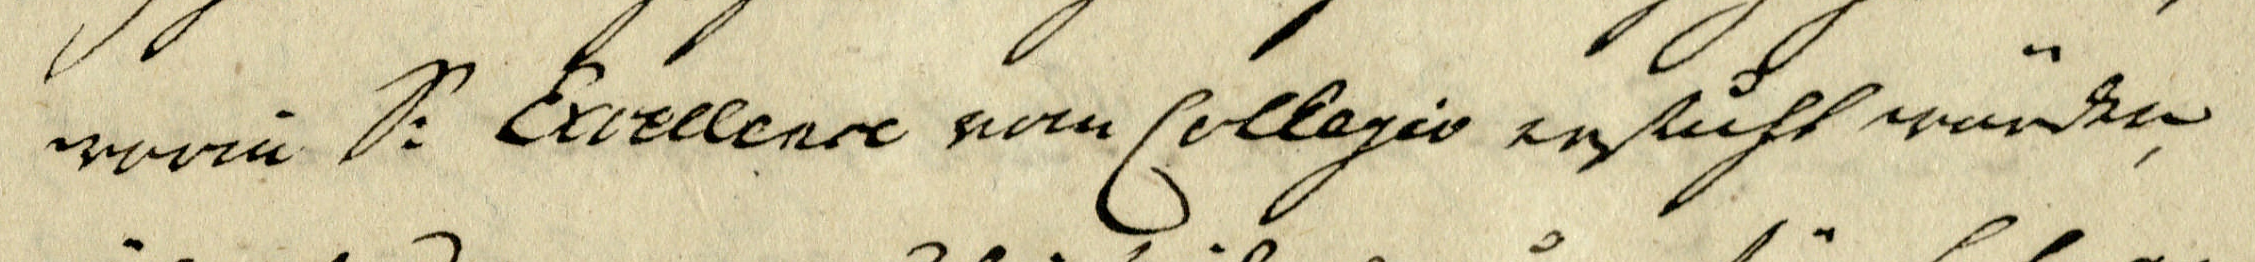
worin Sr Excellence vom Collegio ersucht würden,
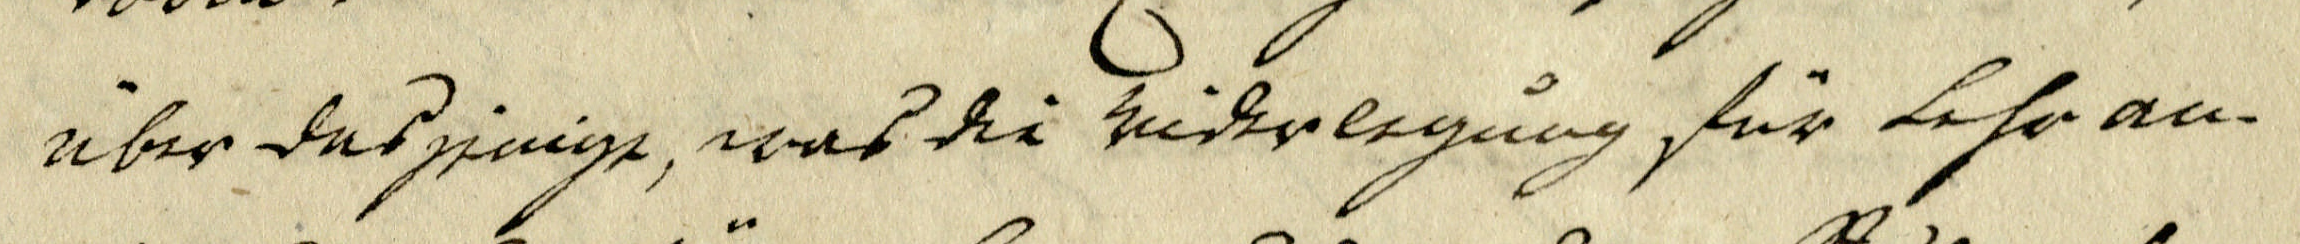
über dasjenige, was die Widerlegung für Lehran¬
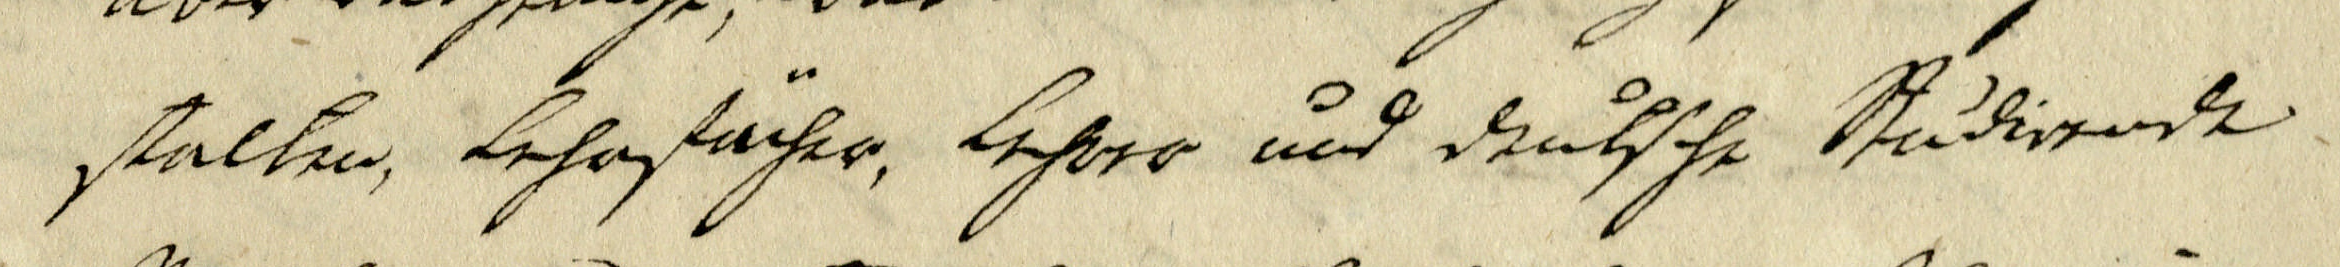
stalten, Lehrfächer, Lehrer und deutsche Studirende
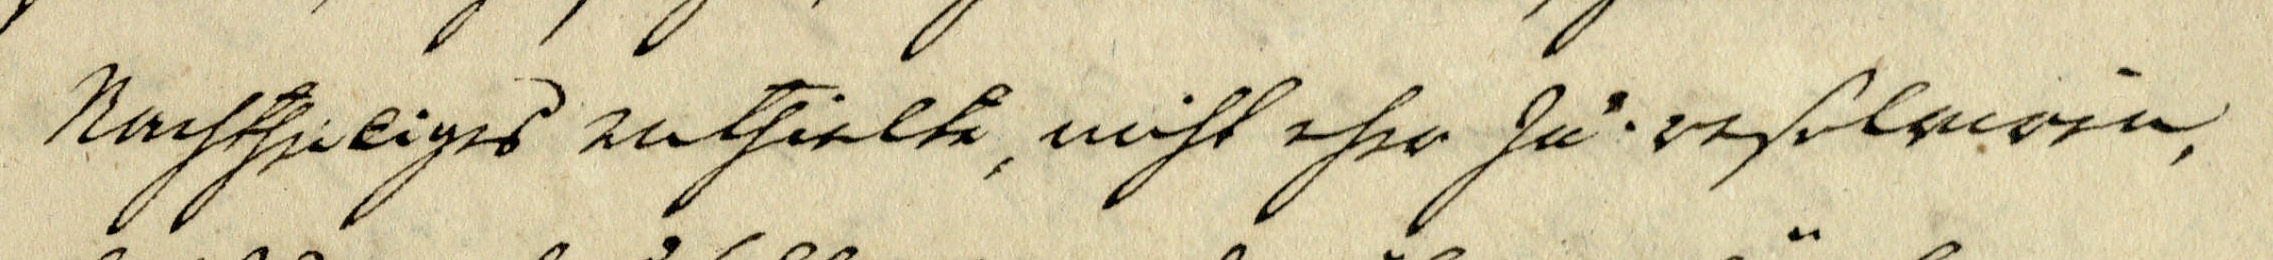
Nachtheiliges enthielte, nicht eher zu resolviren,
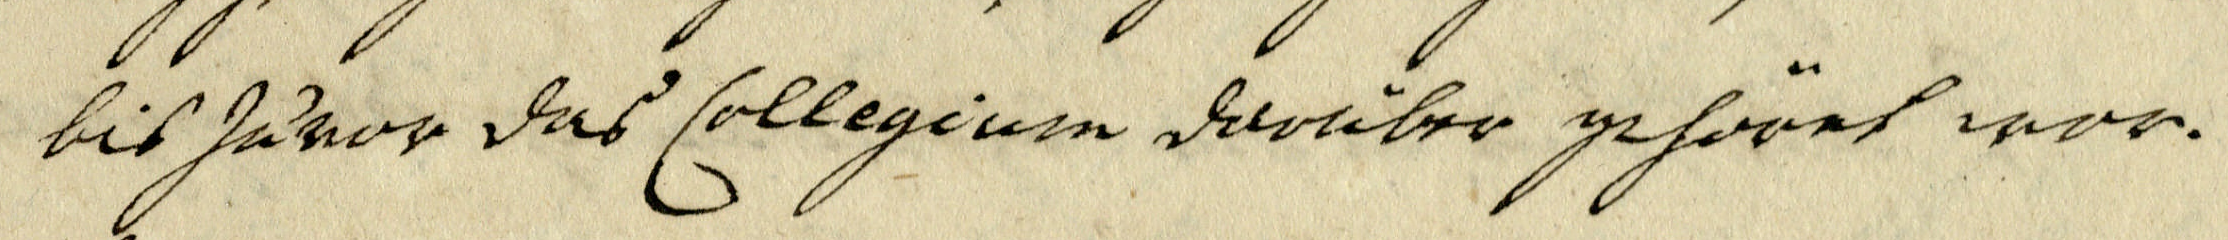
bis zuvor das Collegium darüber gehöret wor¬
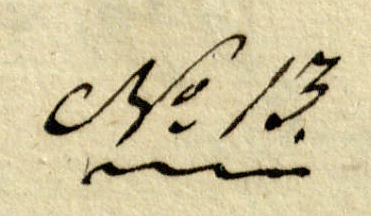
No 13.
